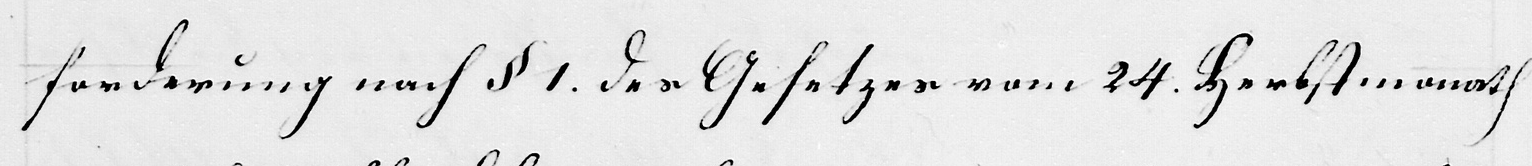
forderung nach § 1. des Gesetzes vom 24. Herbstmonath
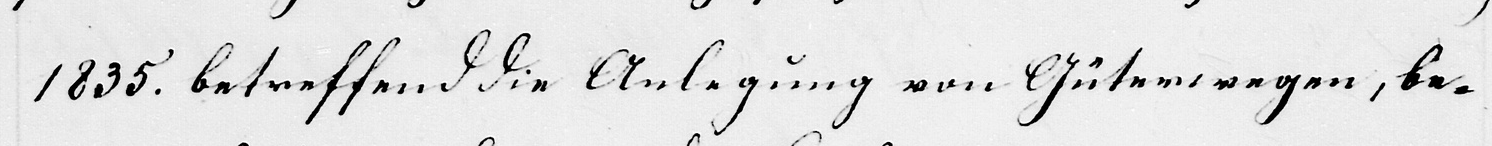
1835. betreffend die Anlegung von Güterwegen, be¬
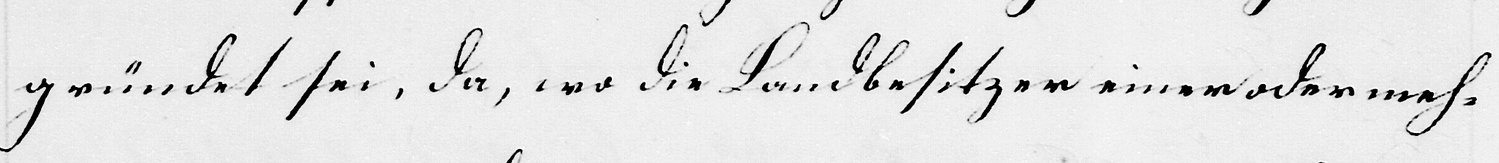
gründet sei, da, wo die Landbesitzer einer oder meh¬
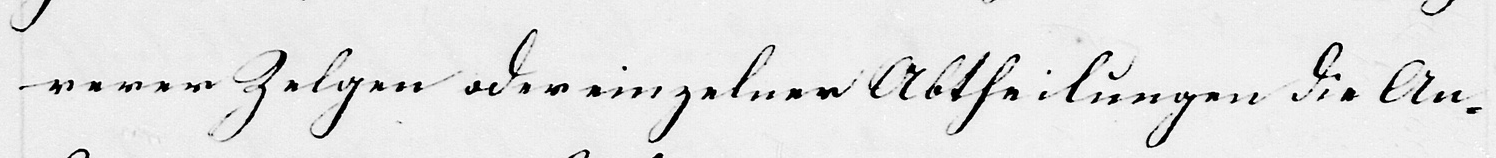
rerer Zelgen oder einzelner Abtheilungen die An¬
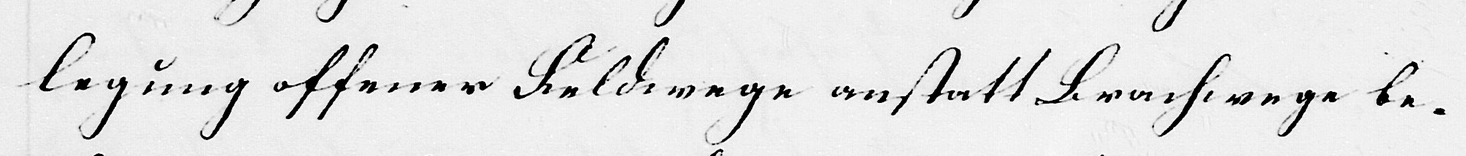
legung offener Feldwege anstatt Brachwege be¬
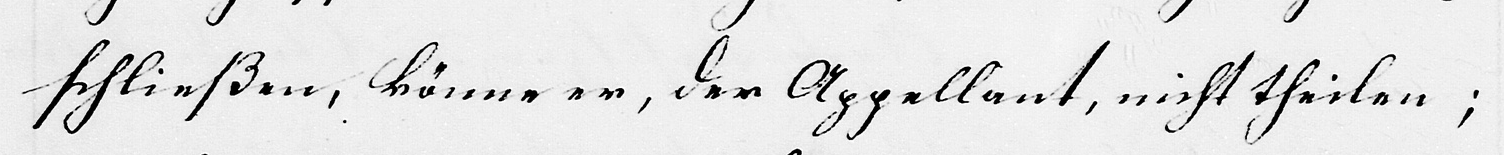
schließen, könne er, der Appellant, nicht theilen;
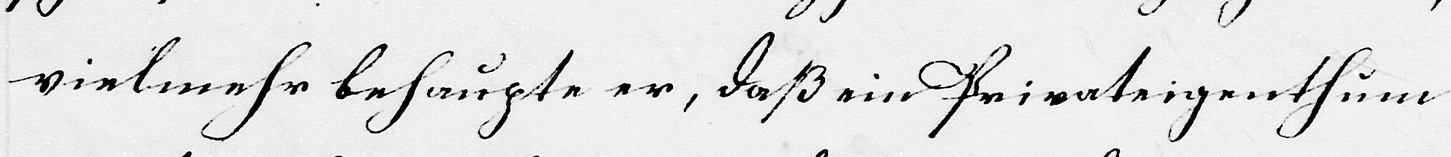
vielmehr behaupte er, daß ein Privateigenthum
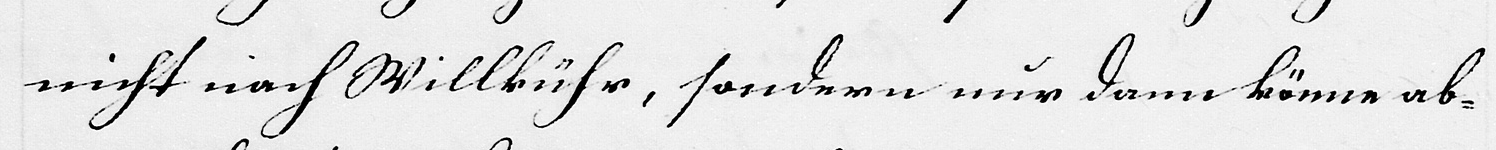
nicht nach Willkühr, sondern nur dann könne ab¬
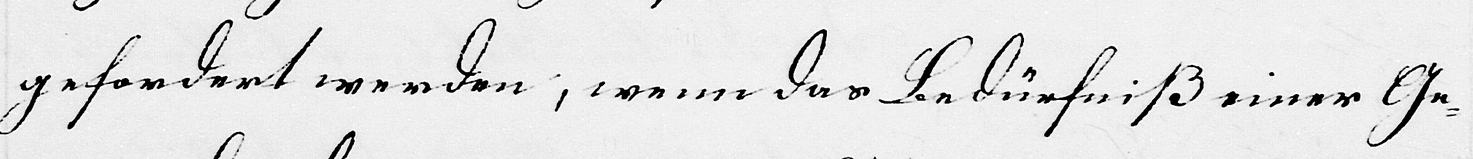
gefordert werden, wenn das Bedürfniß einer Ge¬
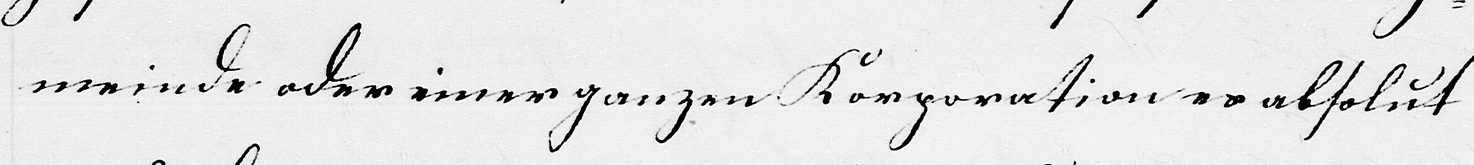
meinde oder einer ganzen Korporation es absolut
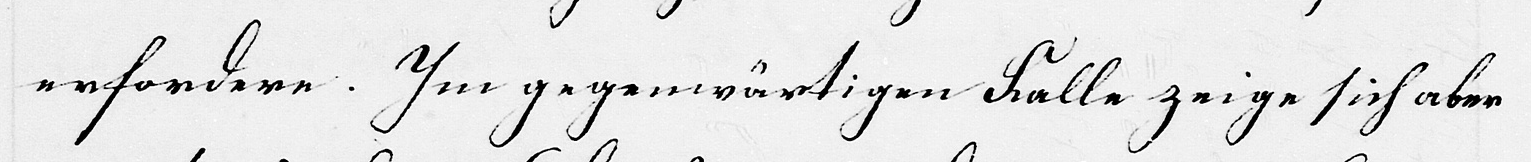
erfordere. Im gegenwärtigen Falle zeige sich aber
